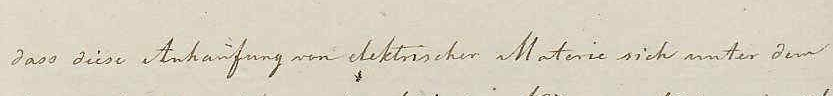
dass diese Anhäufung von elektrischer Materie sich unter dem
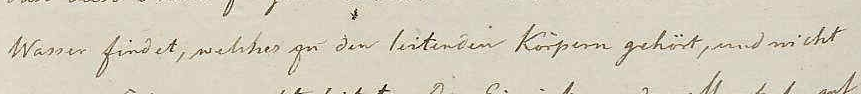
Wasser findet, welches zu den leitenden Körpern gehört, und nicht
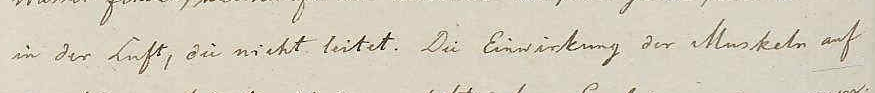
in der Luft, die nicht leitet. Die Einwirkung der Muskeln auf
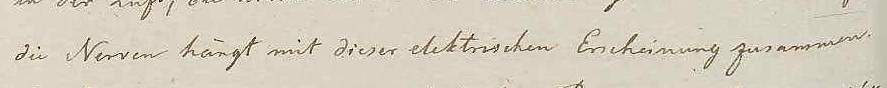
die Nerven hängt mit dieser elektrischen Erscheinung zusammen.
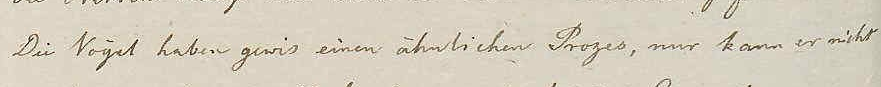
Die Vögel haben gewis einen ähnlichen Prozes, nur kann er nicht
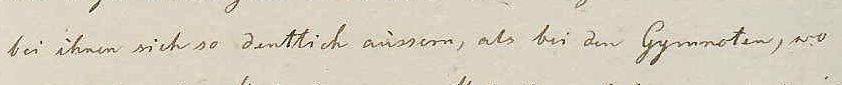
bei ihnen sich so deutlich äussern, als bei den Gymnoten, wo
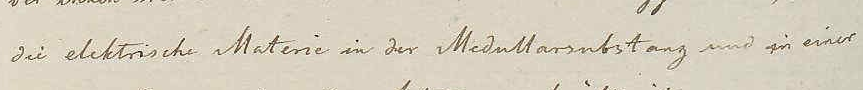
die elektrische Materie in der Medullarsubstanz und in einer
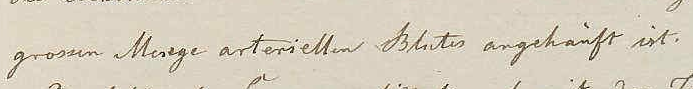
grossen Menge arteriellen Blutes angehäuft ist.
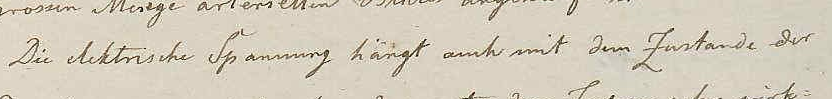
Die elektrische Spannung hängt auch mit dem Zustande der
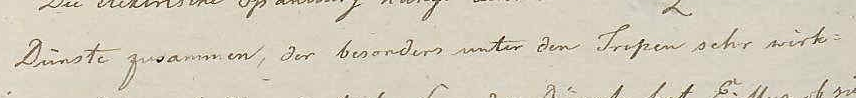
Dünste zusammen, der besonders unter den Tropen sehr wirk-
